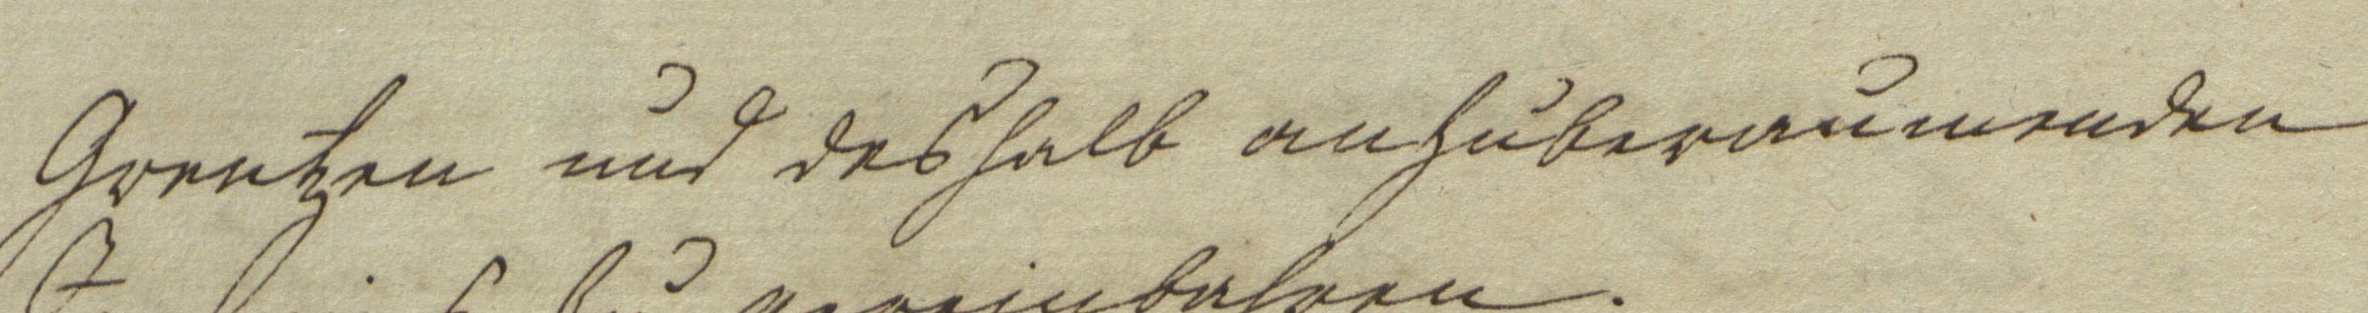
Grentzen und deshalb anzuberaumenden
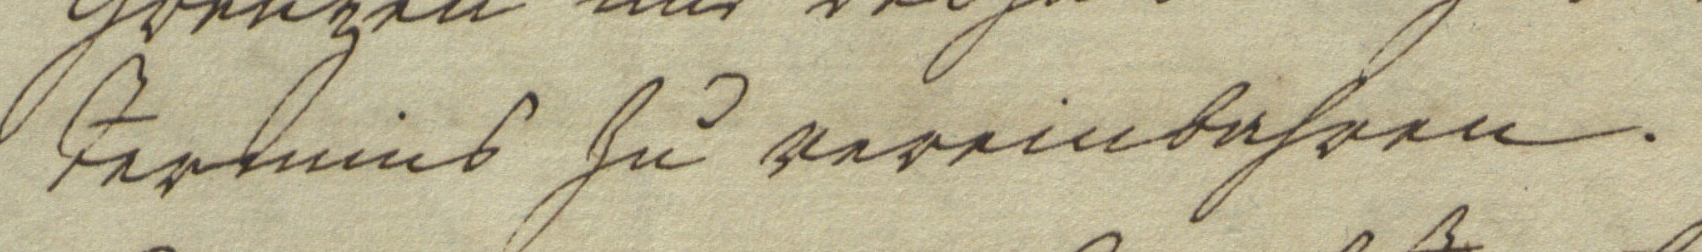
Termins zu vereinbahren.
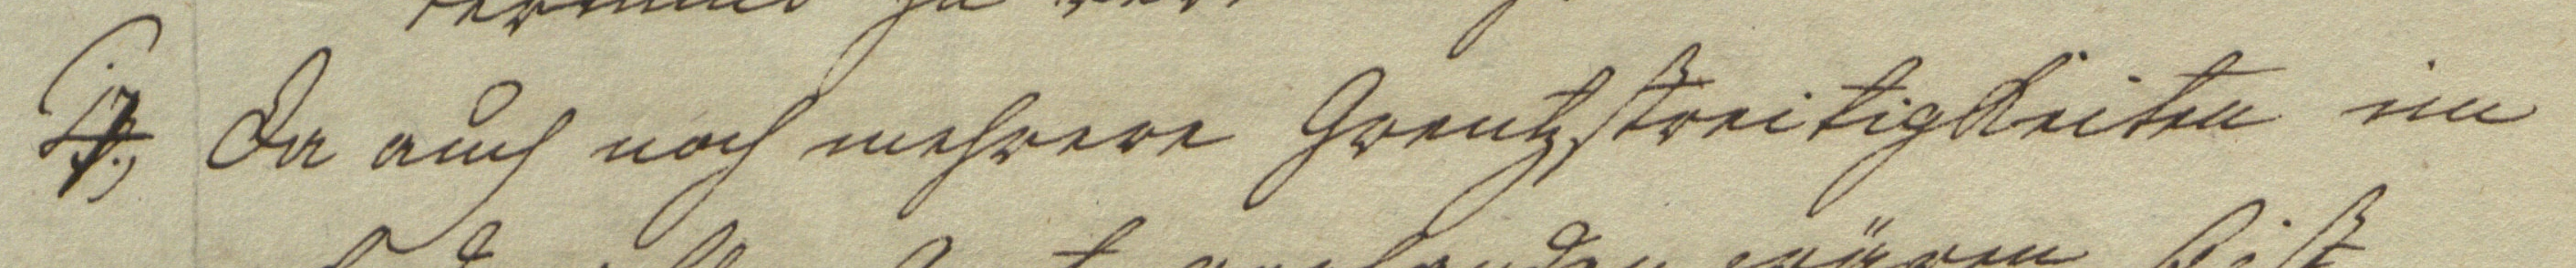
4., Da auch noch mehrere Grentzstreitigkeiten im
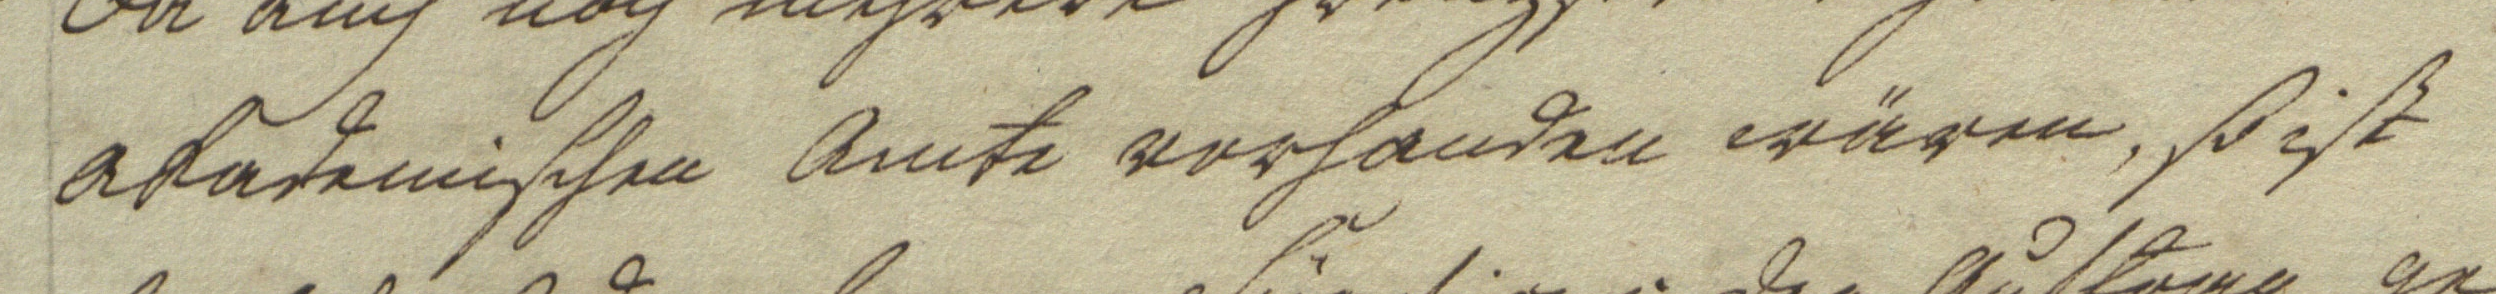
akademischen Amte vorhanden wären, so ist
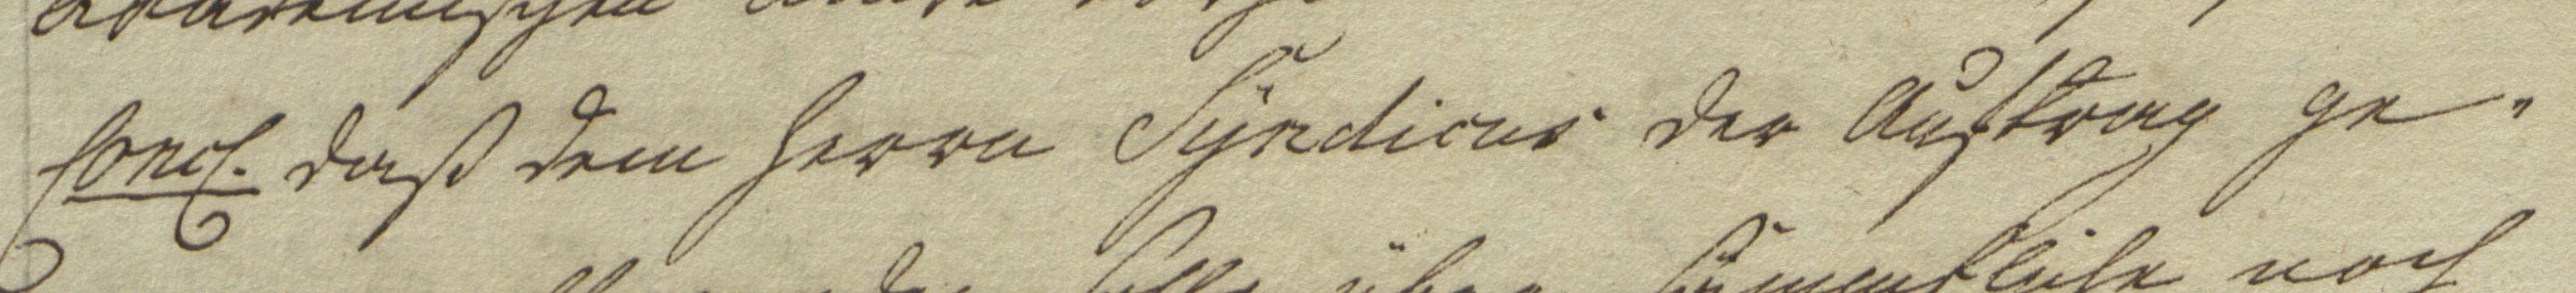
Concl. daß dem Herrn Sÿndicus der Auftrag ge¬
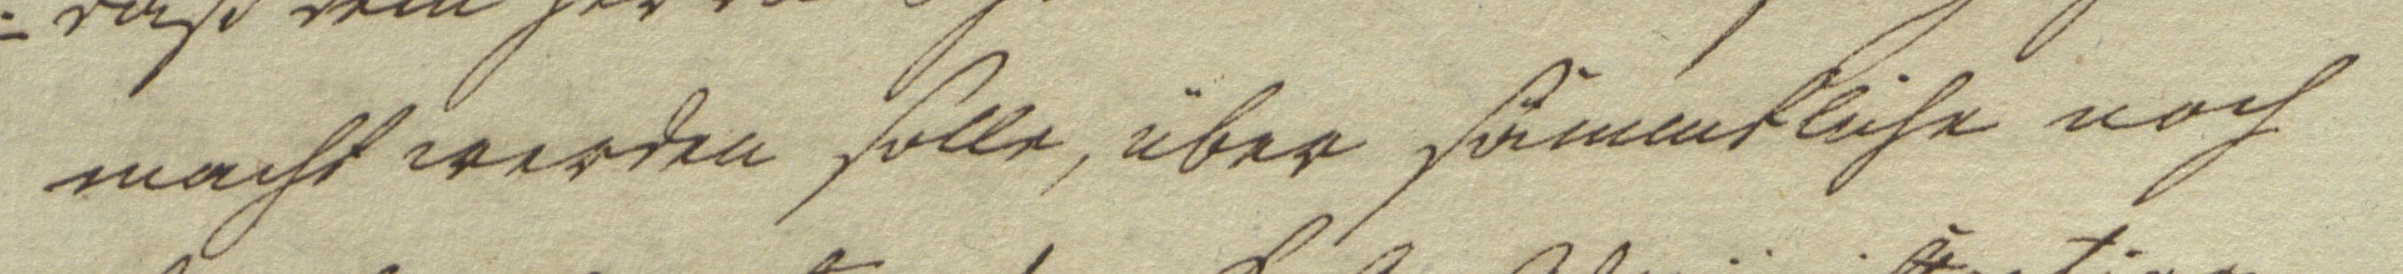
macht werden solle, über sämmtliche noch
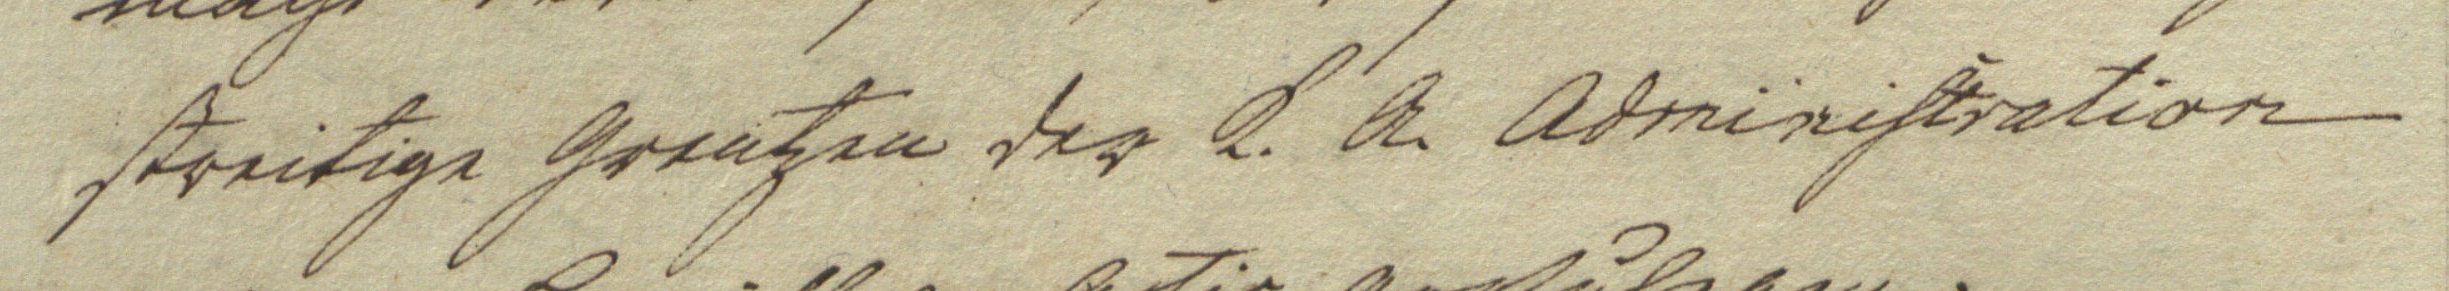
streitige Grentzen der K. A. Administration
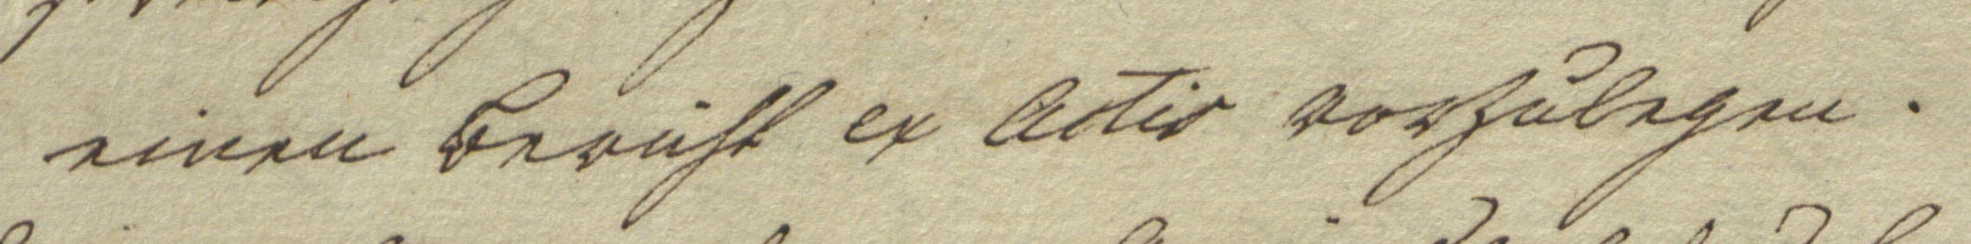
einen Bericht ex Actis vorzulegen.
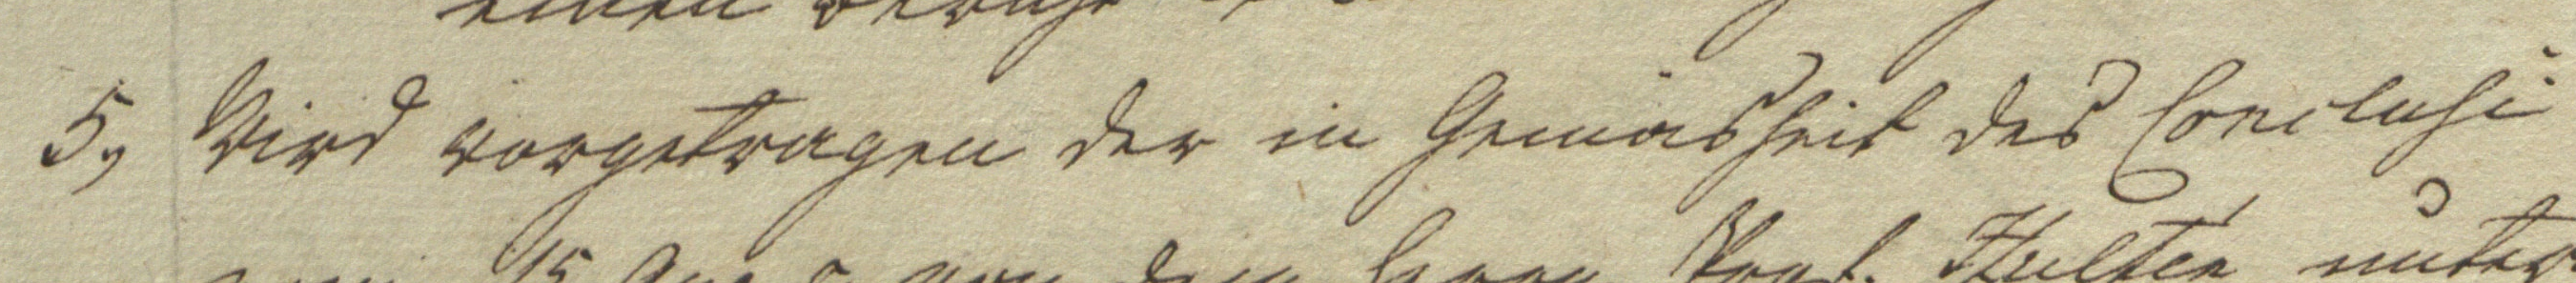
5., Wird vorgetragen der in Gemäsheit des Conclusi
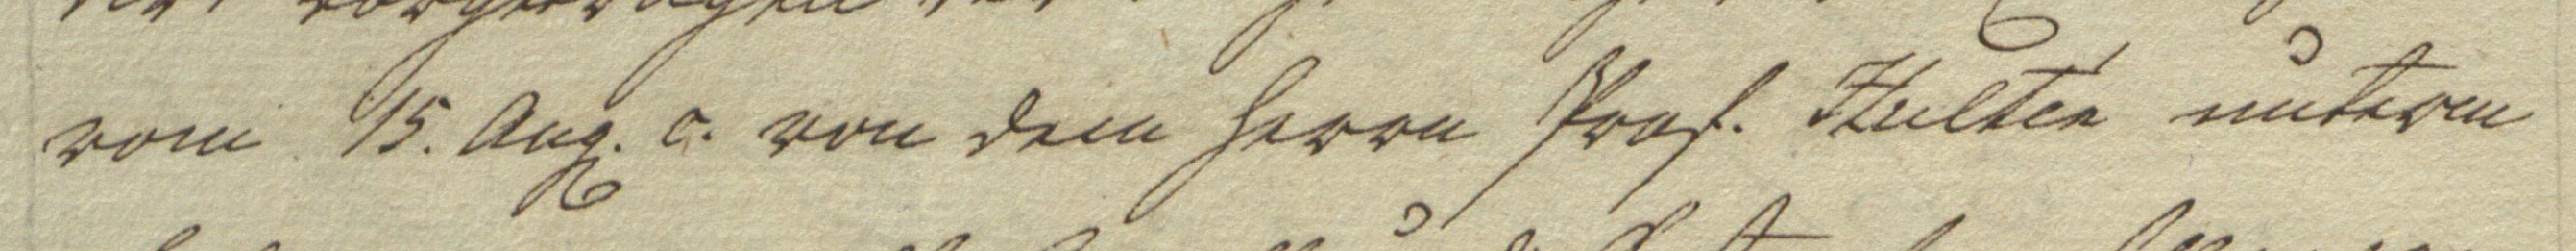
vom 15. Aug. c. von dem Herrn Prof. Hultén unterm
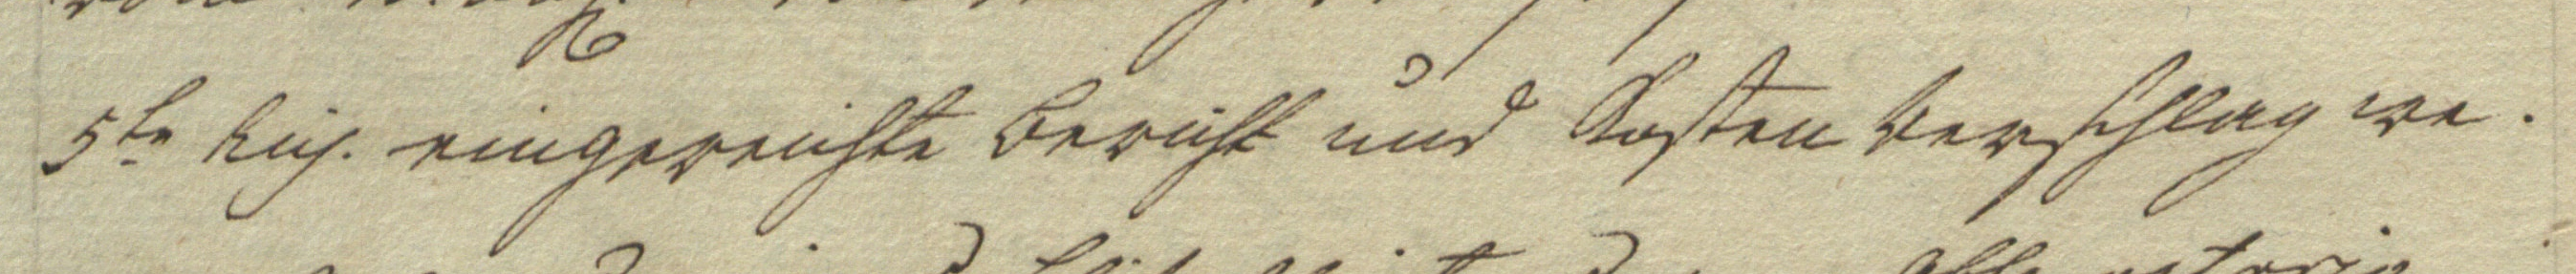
5 te huj. eingereichte Bericht und Kosten Verschlag we¬
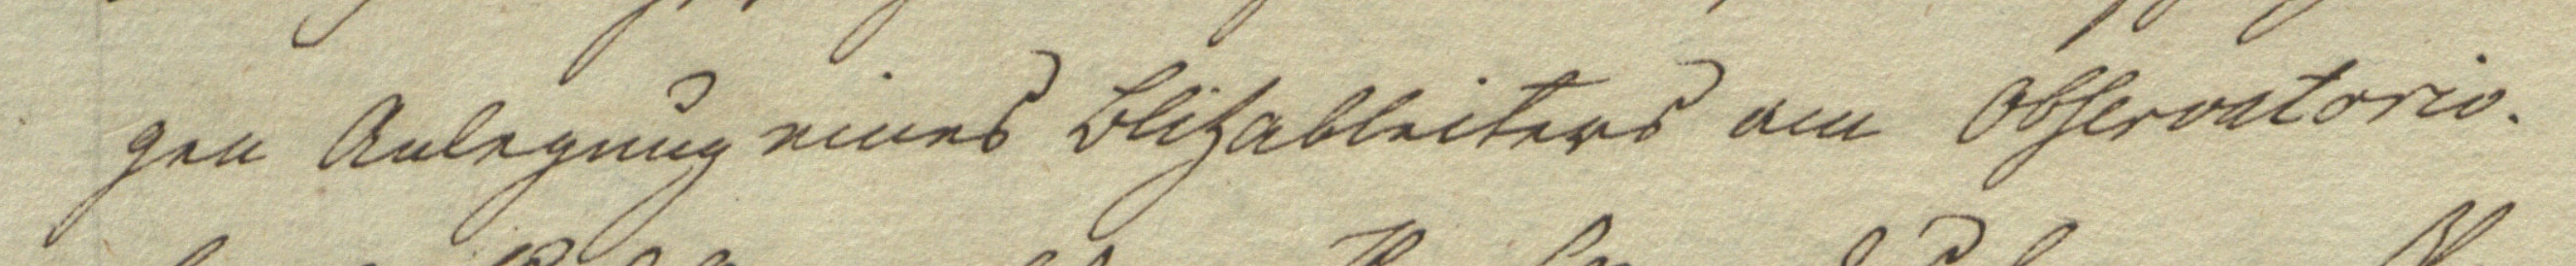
gen Anlegung eines Blizableiters am Observatorio.
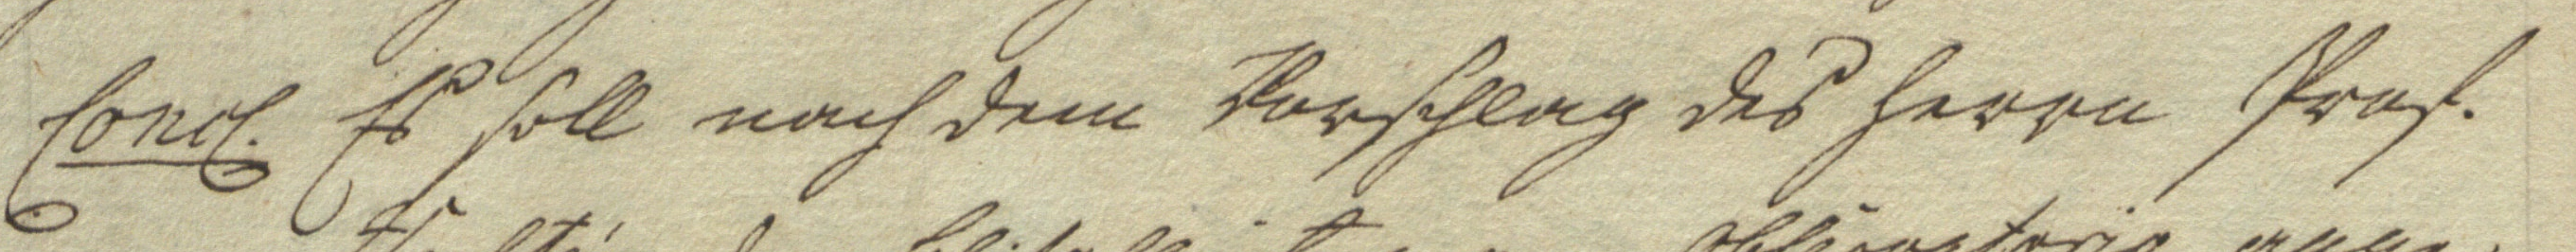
Concl. Es soll nach dem Vorschlag des Herrn Prof.
